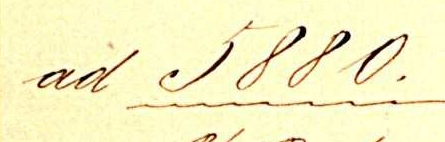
ad 5880
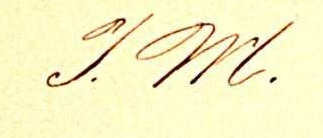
J.M.
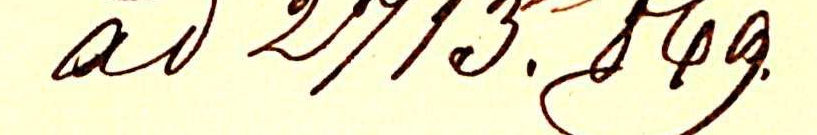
ad 2713. 849
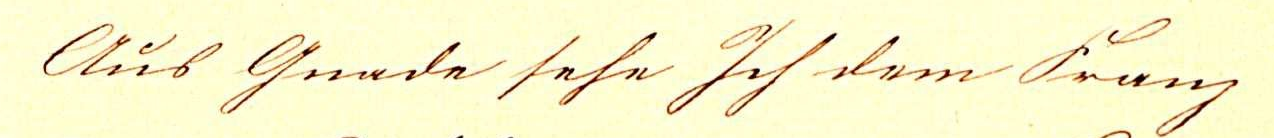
Aus Gnade sehe Ich dem Franz
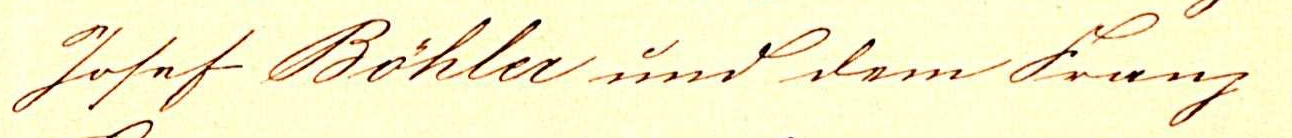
Josef Böhler und dem Franz
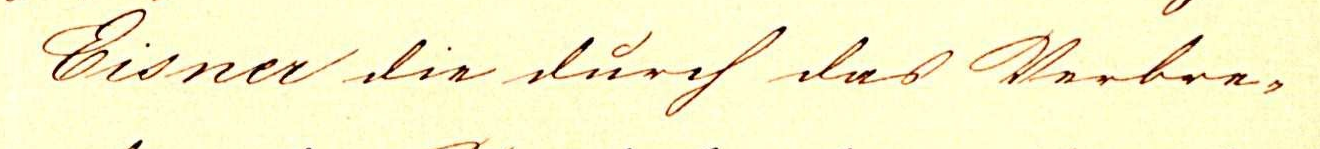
Eisner die durch das Verbre¬
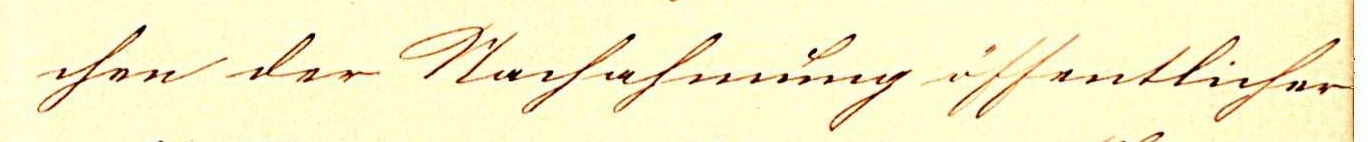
chen der Nachahmung öffentlicher
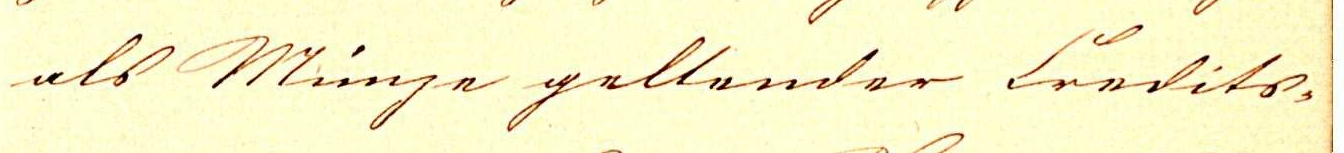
als Münze geltender Credits¬
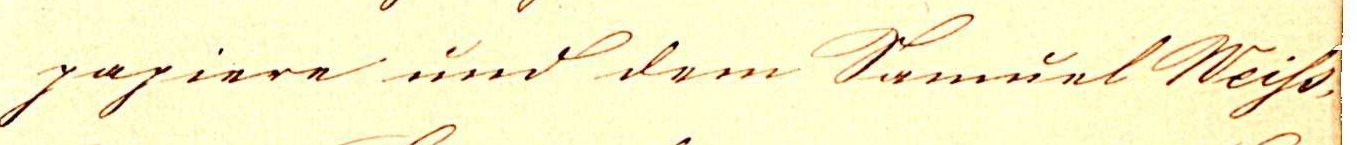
papiere und dem Samuel Weiss,
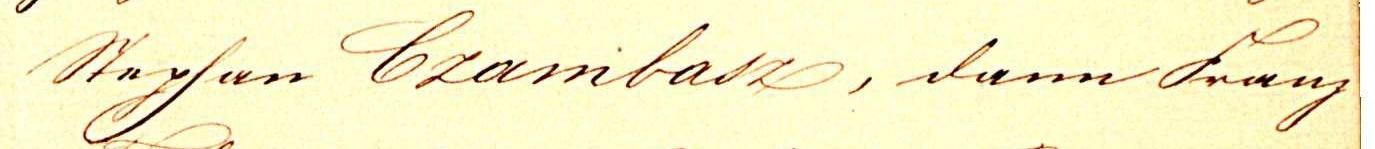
Stephan Czambasz, dann Franz
